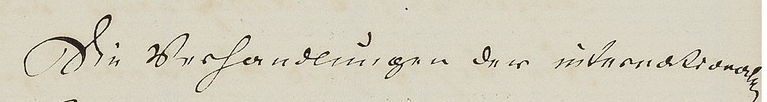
Die Verhandlungen der internationalen
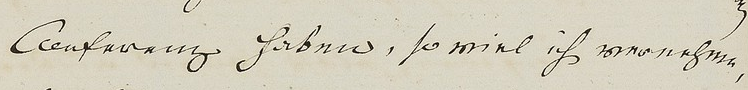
Conferenz haben, so viel ich vernehme,
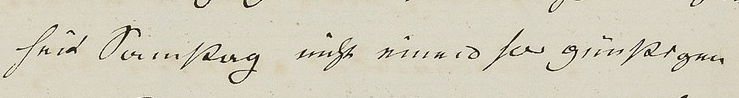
seit Samstag nicht einen so günstigen
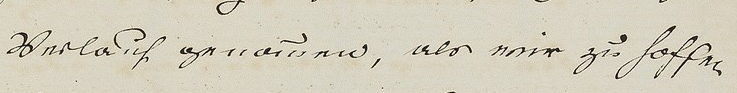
Verlauf genommen, als wir zu hoffen
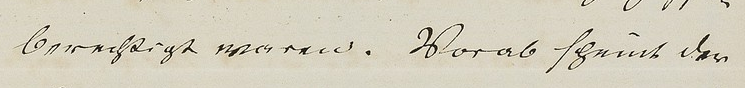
berechtigt waren. Vorab scheint der
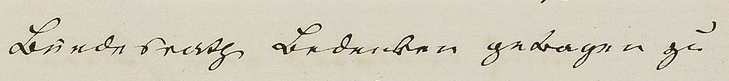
Bundesrath Bedenken getragen zu
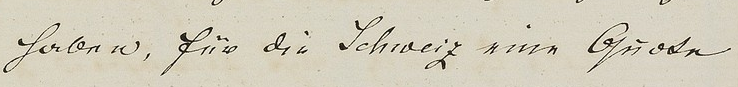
haben, für die Schweiz eine Quote
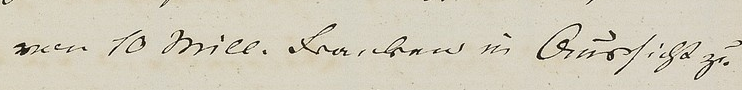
von 10 Mill. Franken in Aussicht zu
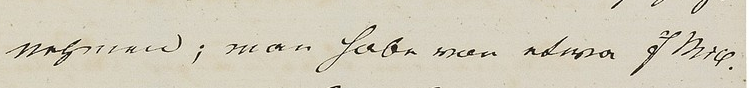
nehmen; man habe von etwa 7 Mill.
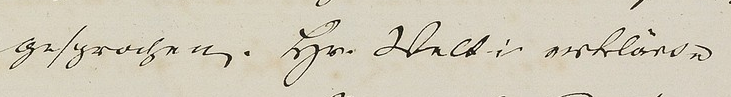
gesprochen. Hr. Welti erklärte
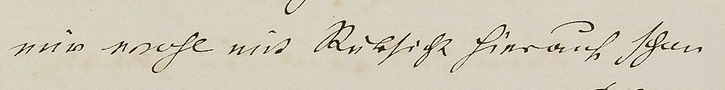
mir wohl mit Rüksicht hierauf schon
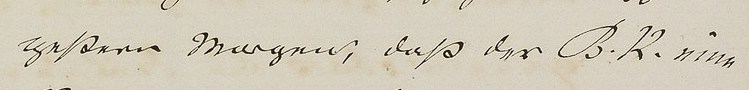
gestern Morgen, daß der B.R. eine
